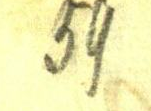59
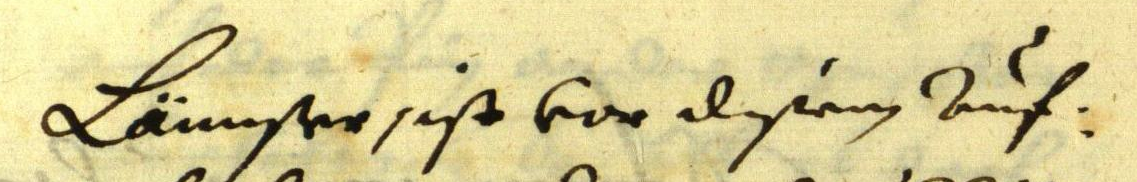Lännser, ist vor disem Aūf¬
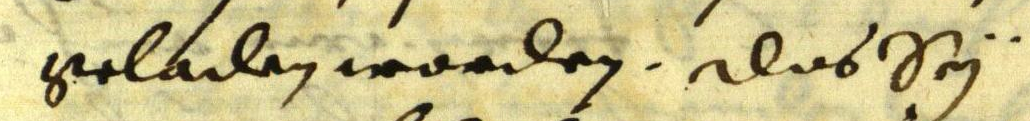geladen worden. das Sÿ
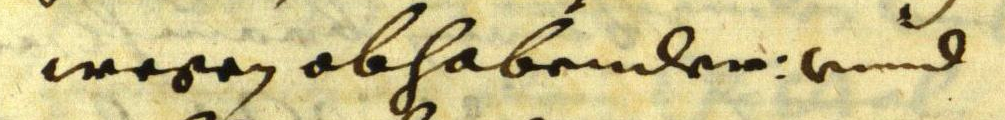wegen obhabender: vnnd
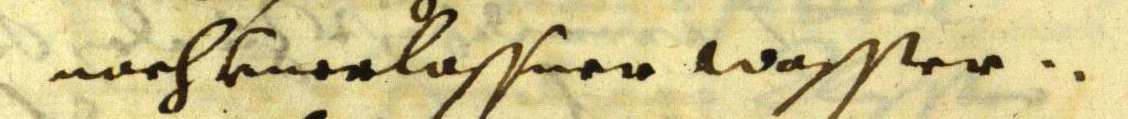nach verlassner Wasser¬
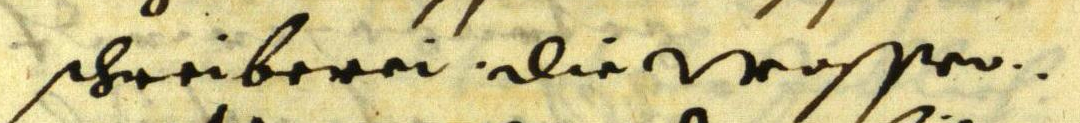schreiberei. die Wasser¬
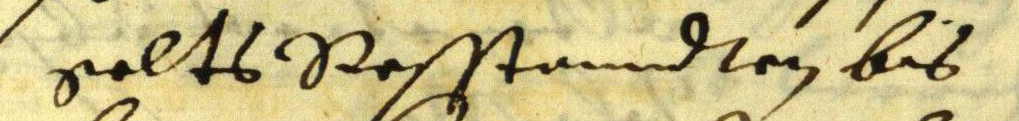gelts Resstanndten bis
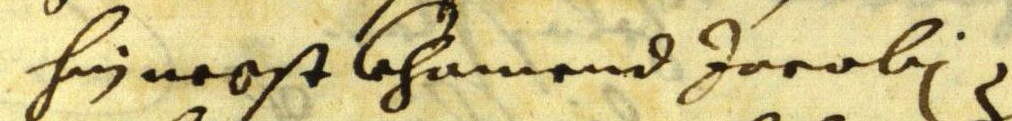hin negst khomend Jacobj
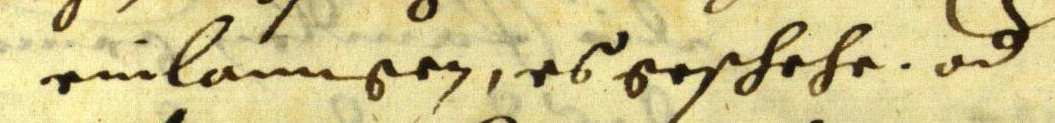einlanngen, es geschehe. od
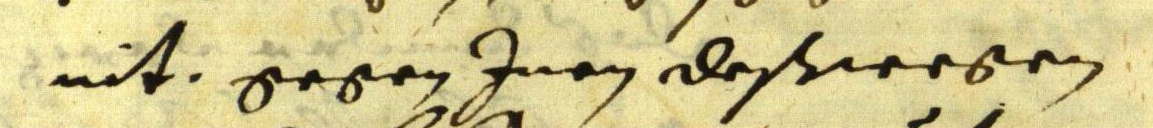nit. gegen Inen deßwegen
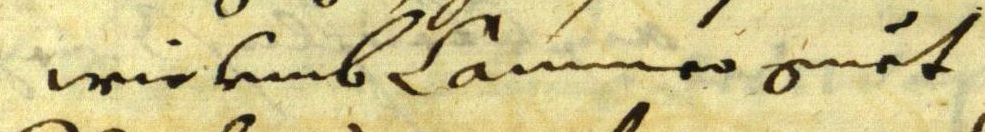wie vmb Cammer gūet
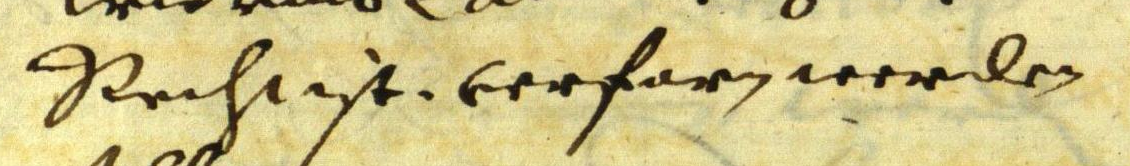Recht ist. verfarn werden
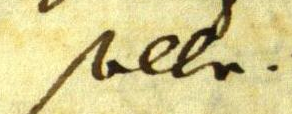solle.
